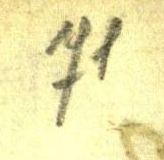71
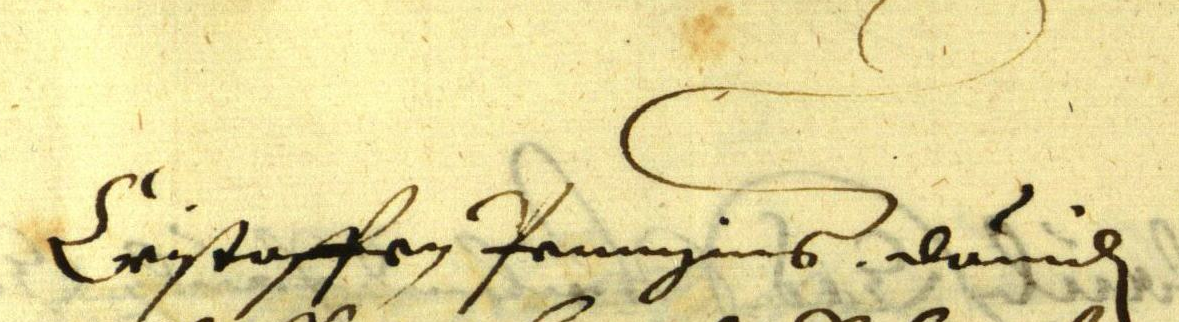Cristoffen Pennzing. Daūiden
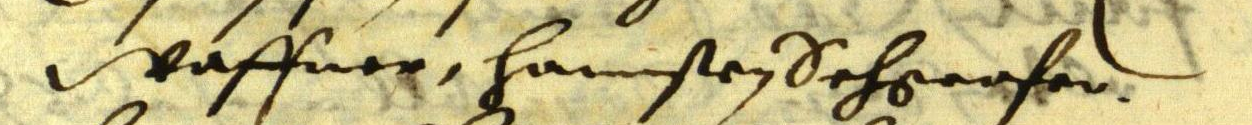Waffner, hannsen Schgrafer.
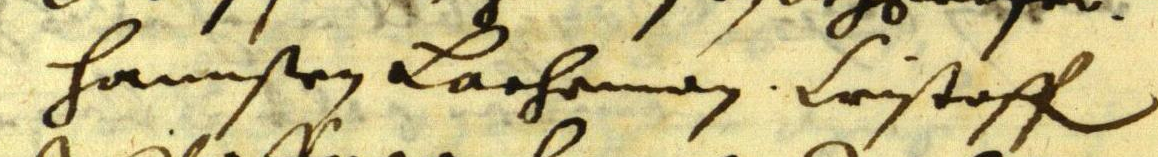hannsen Lacheman. Cristoff
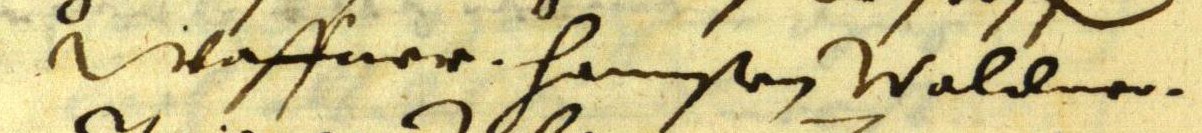Waffner. hannsen Waldner,
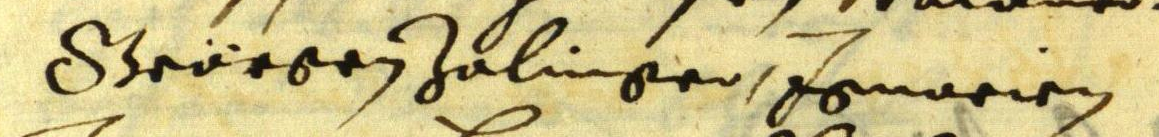Geörgen Zalinger, Ignacien
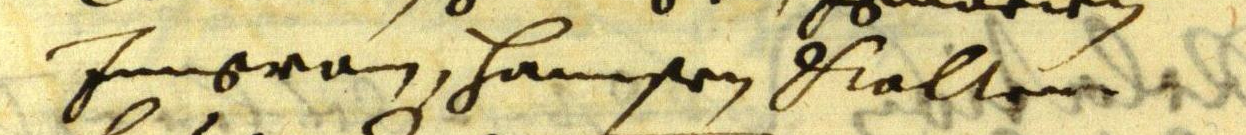Inngram, hannsen Kalten¬
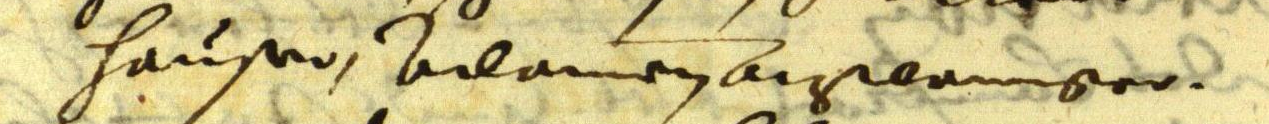haūser, Adamen Azwannger.
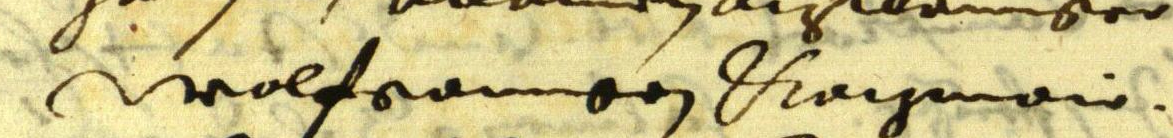Wolfganngen Kazmair.
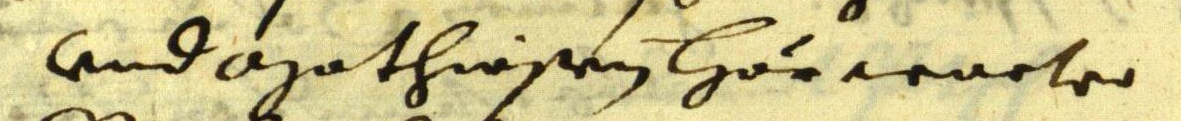vnd Mathiesen Hōrwarter
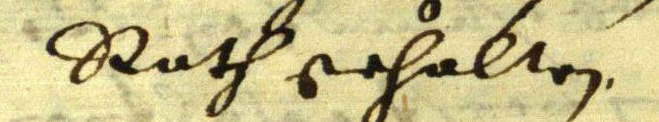Rath gehalten.
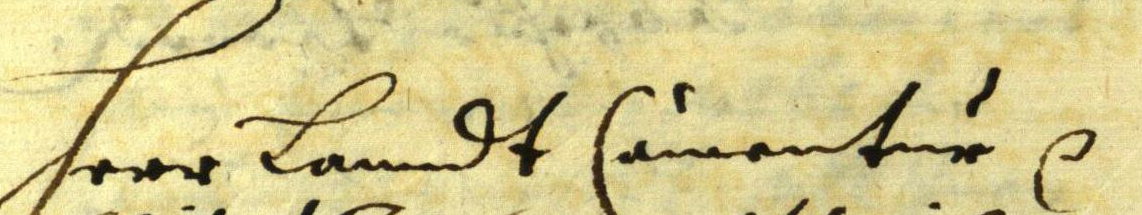herr Lanndt Comentūr etc.
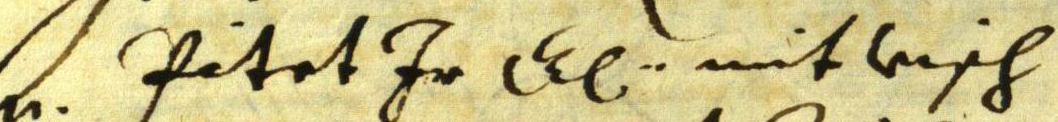Pitet Ir G: mit visch
